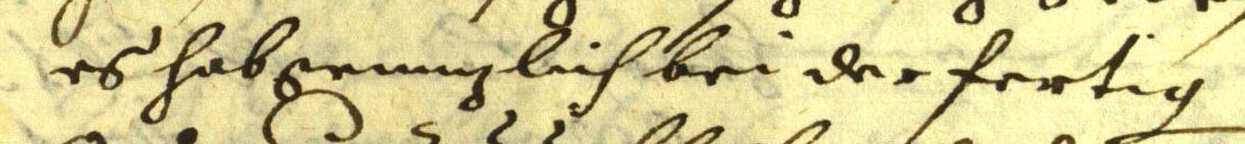es hab gennzlich bei der fertig
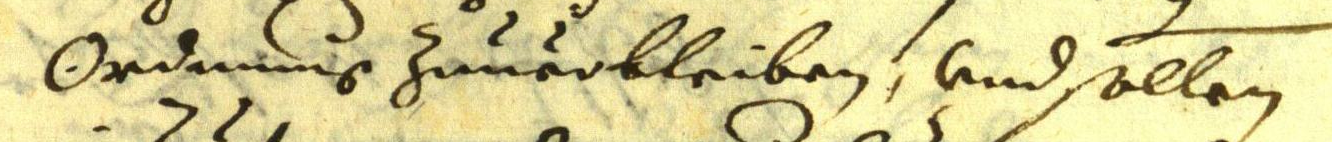Ordnūng Zūūerbleiben, vnd sollen
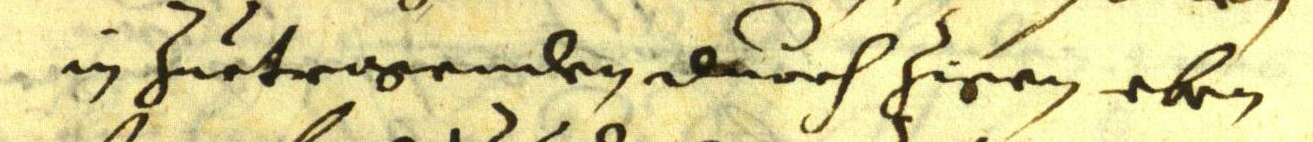in Zūetragenden dūrch Zigen eben
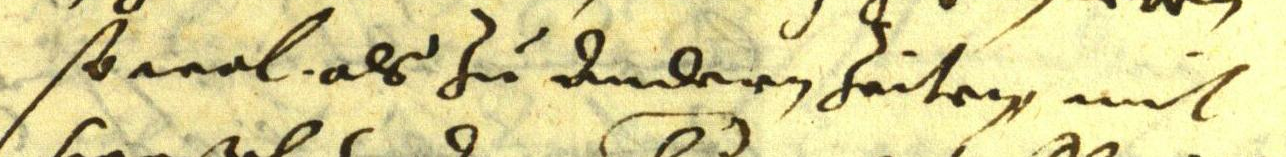so wol. als Zū Andern Zeiten, mit
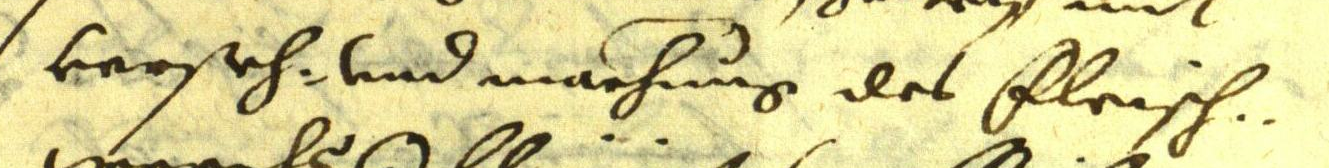verseh. vnd machūng des Fleisch¬
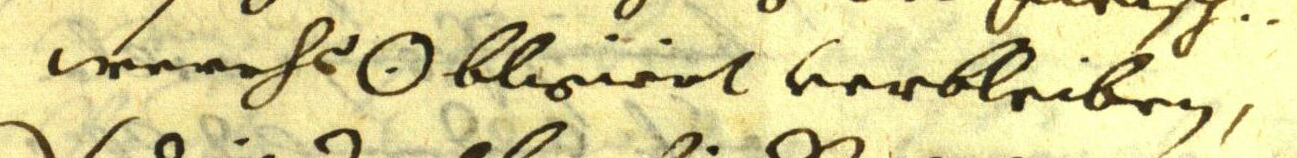werchs Obligiert verbleiben,
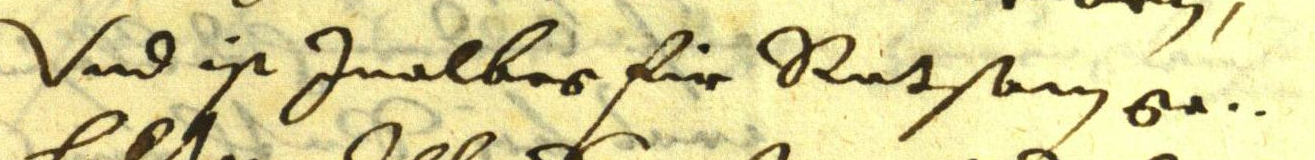Vnd ist Inalbeg fir Ratsam ge¬
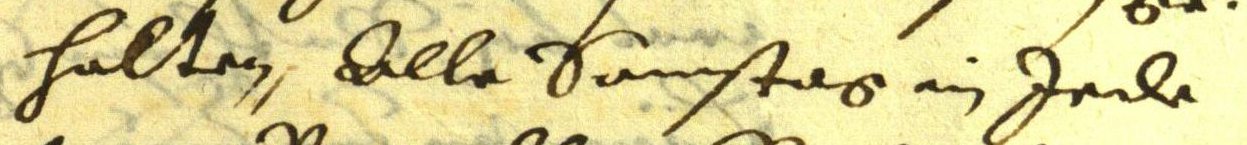halten, Alle Samstag in Jede
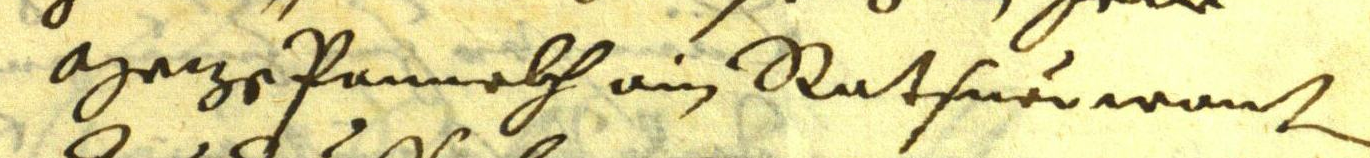Mezg Pannckh ain Ratsuērwant
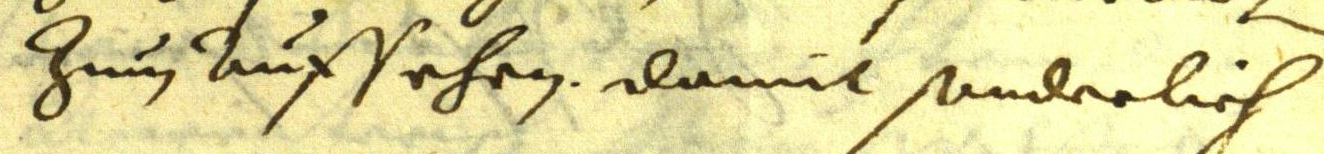Zūm Aūfsehen. damit sonderlich
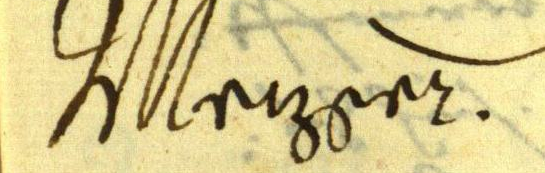Mezger.
